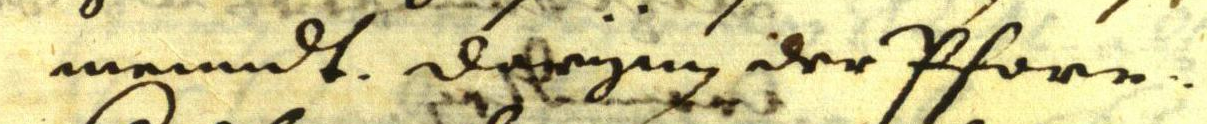menndt. darÿnn der Pfarr¬
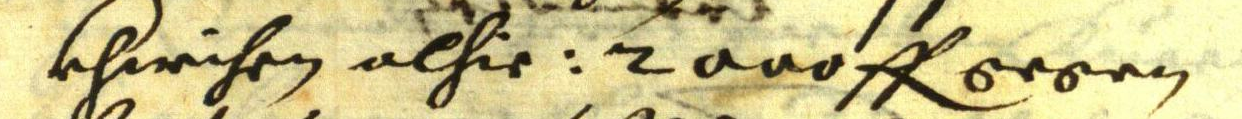khirchen alhie: 2000 fl gegen
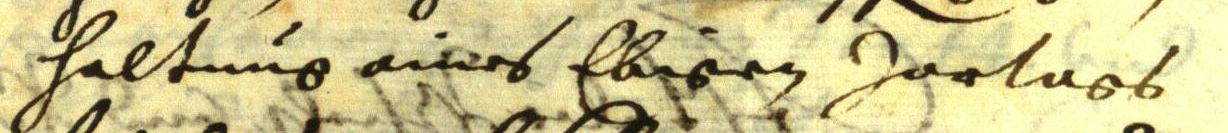haltūng aines Ewigen Jartags
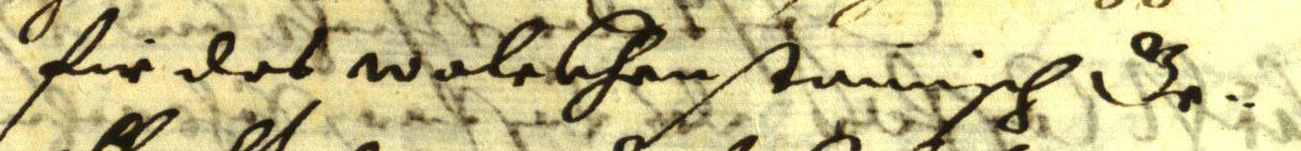fir das wolckhenstainisch Ge¬
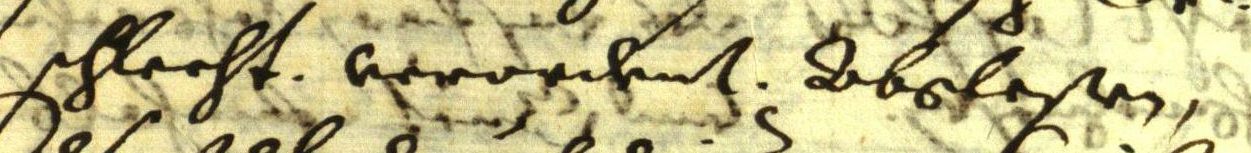schlecht. verordent. Abglesen.
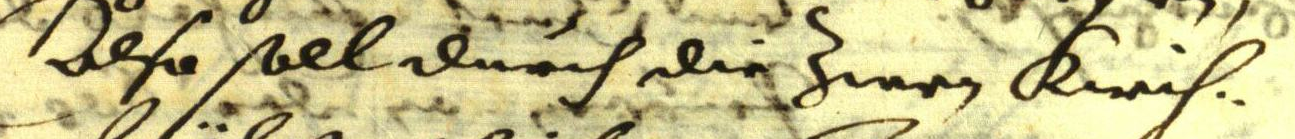Also soll dūrch die Zwen Kirch¬
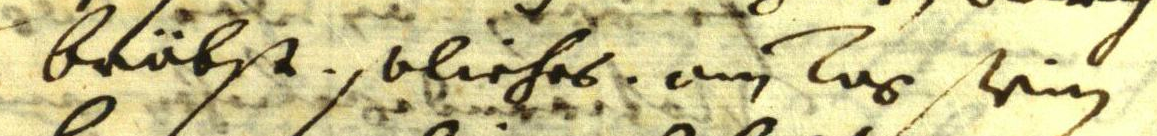bröbst. soliches. am Tag sein
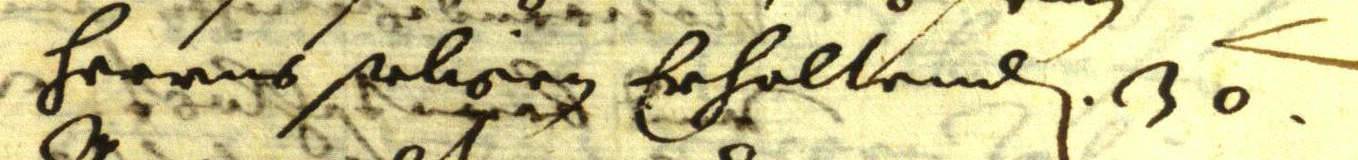Herrens seligen Erhaltend. 30 t.
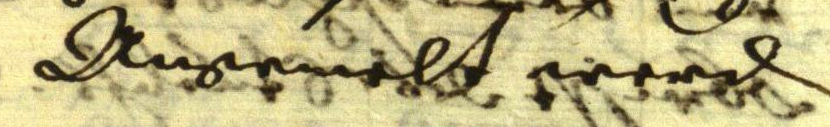Angemelt werd.
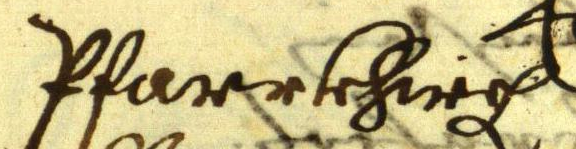Pfarrkhirch
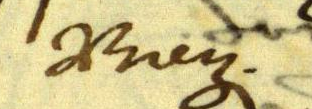Boz.
